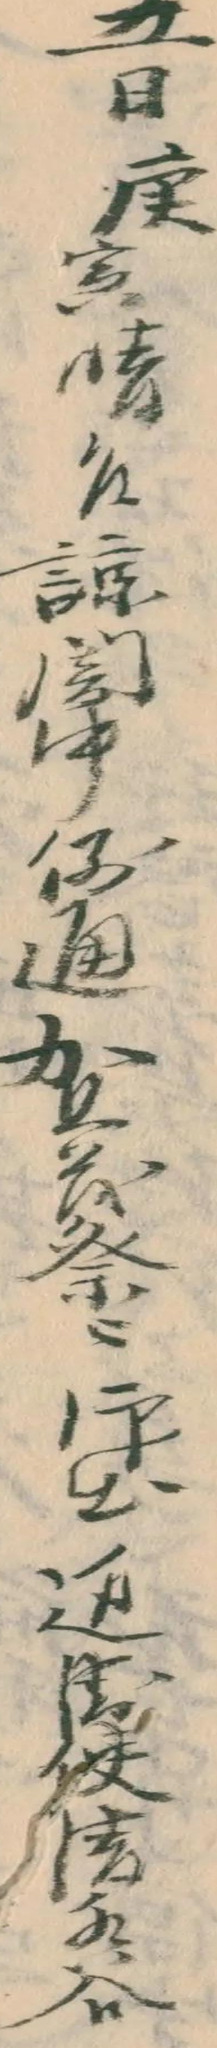五日庚寅晴乍諒闇例通賀茂祭被仰出近衛使清水谷
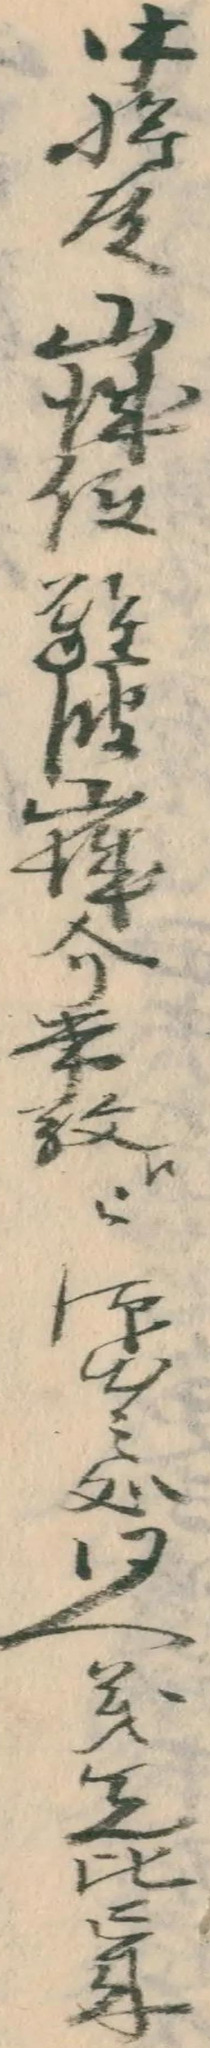中将殿山城便難波山城介常敬江被仰出之処同人義先比已来
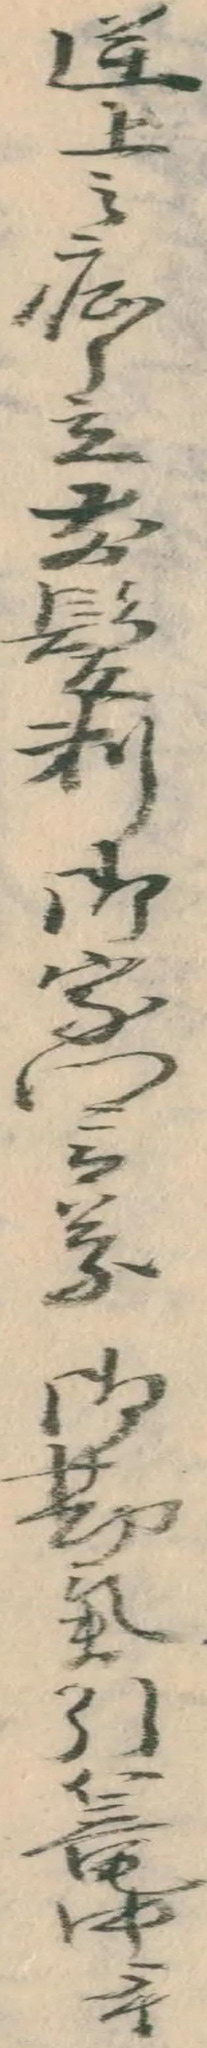逆上之疵立敷髪剃御家門ニ而蒙御勘氣引篭中ニ付
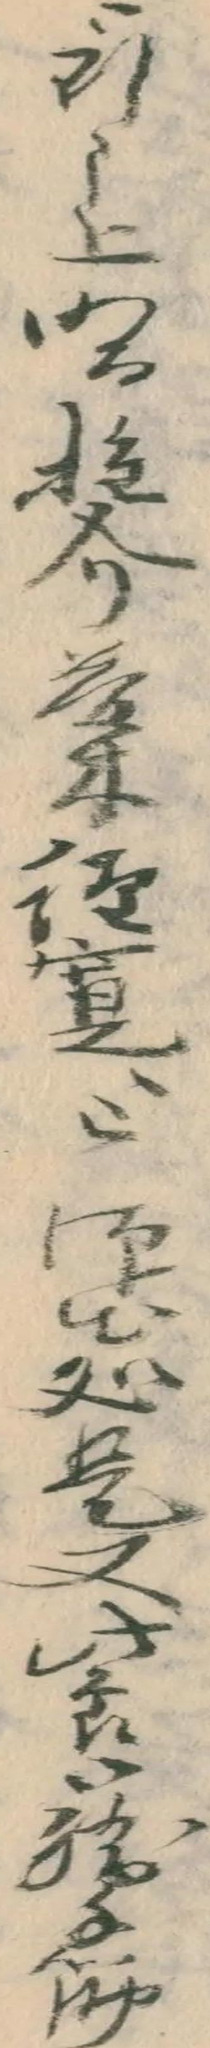御断申上仍而権介藤木経寛へ被仰出処是又此節御勝手筋
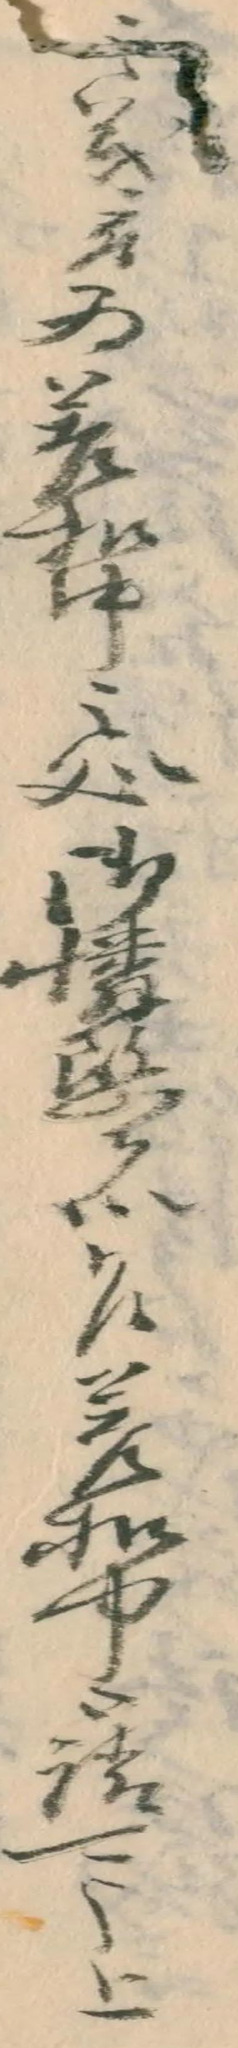之義ニ付為差扣中之処御憐愍ヲ以乍差扣中御請可申上
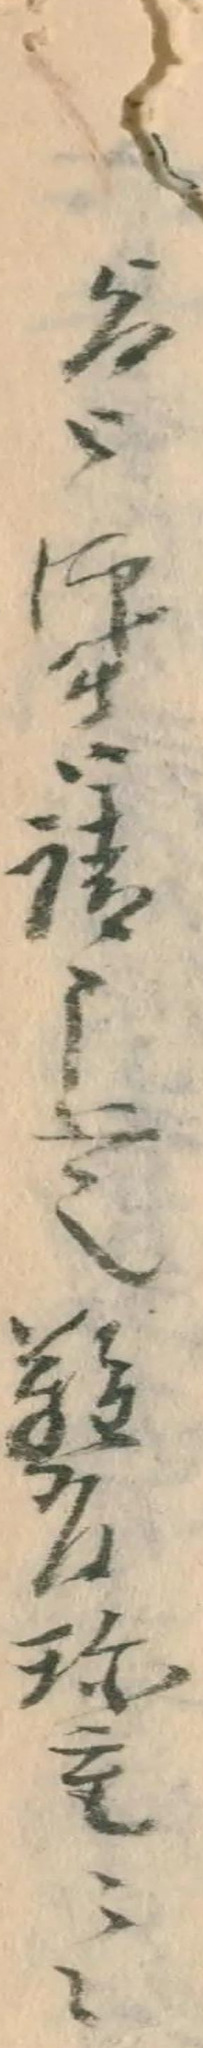旨被仰付御請申上也難有珍重々々

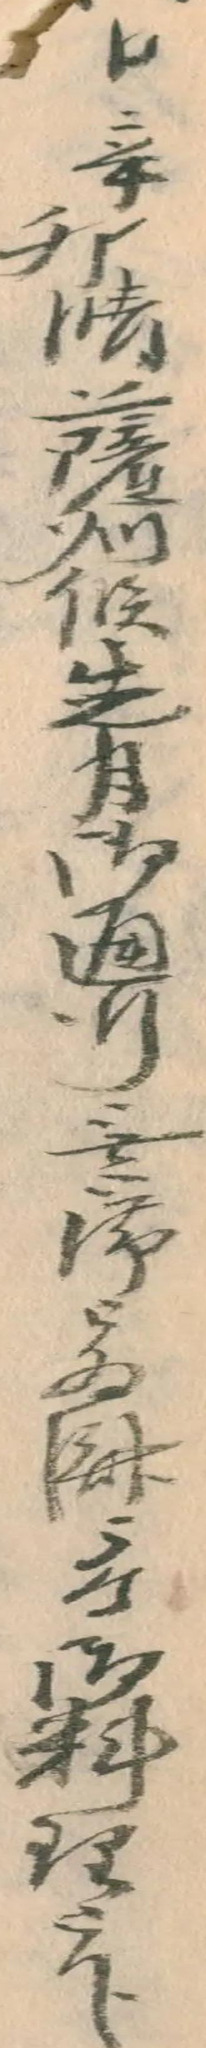六日辛卯晴薩州侯先月御通行無滞被為済ニ付御料理被下
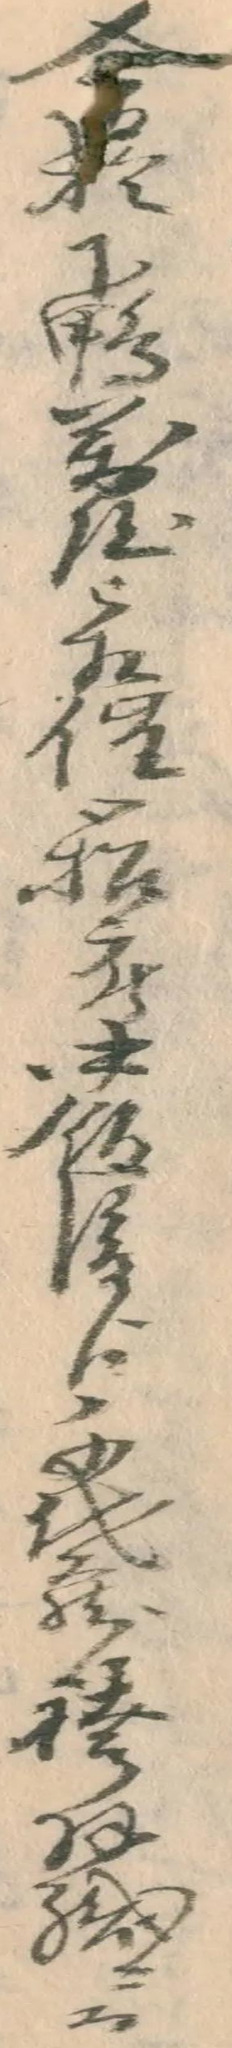今日於下鴨萬屋被相催御招ニ付中飯後ゟ千代蔵袴羽織ニ而
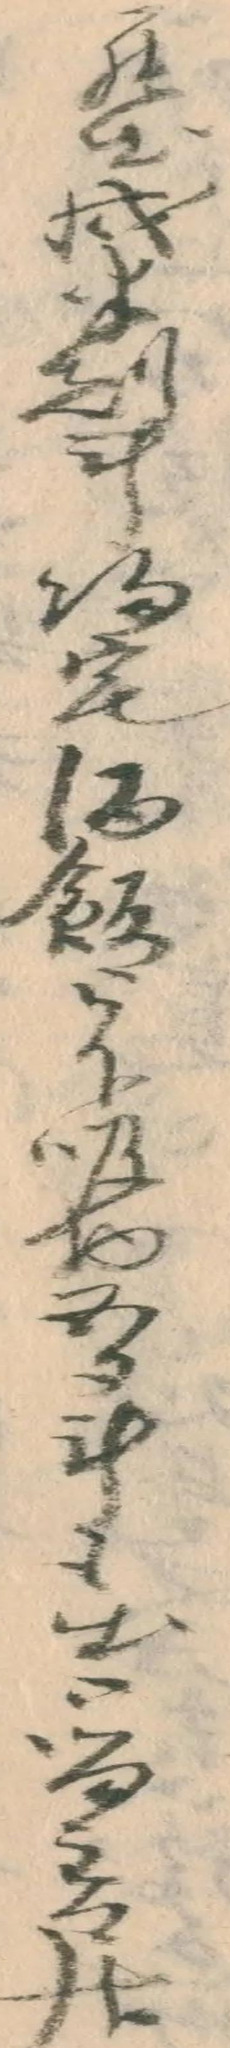罷出戌半刻斗帰宅酒飯被下吸物五ツ斗も出御留主居
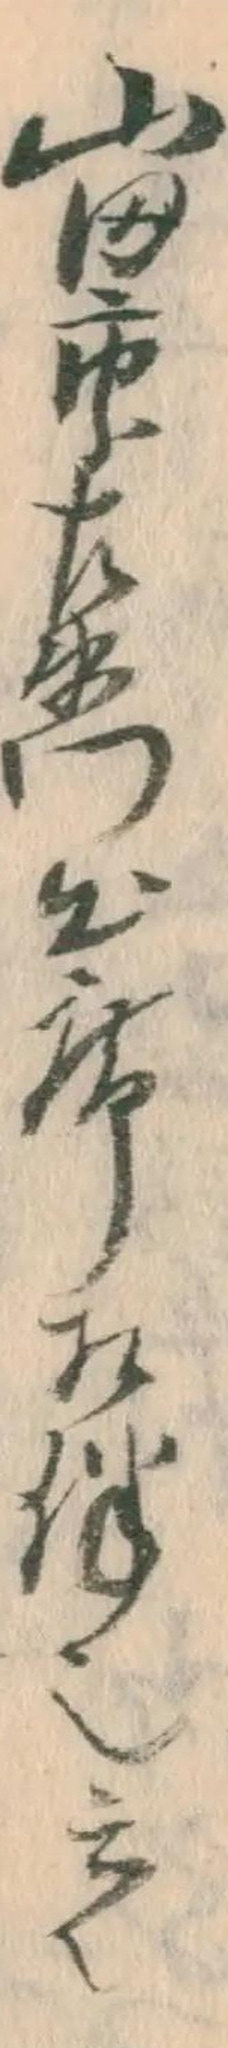山田市郎左衛門出席相伴也云々
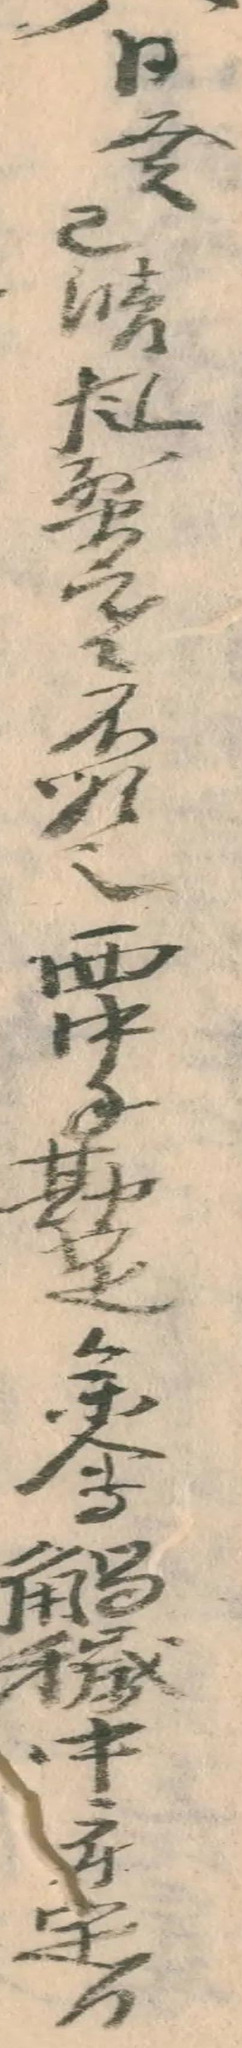八日癸巳晴風烈寒不順也西中手勘定参會觸穢中ニ付定日
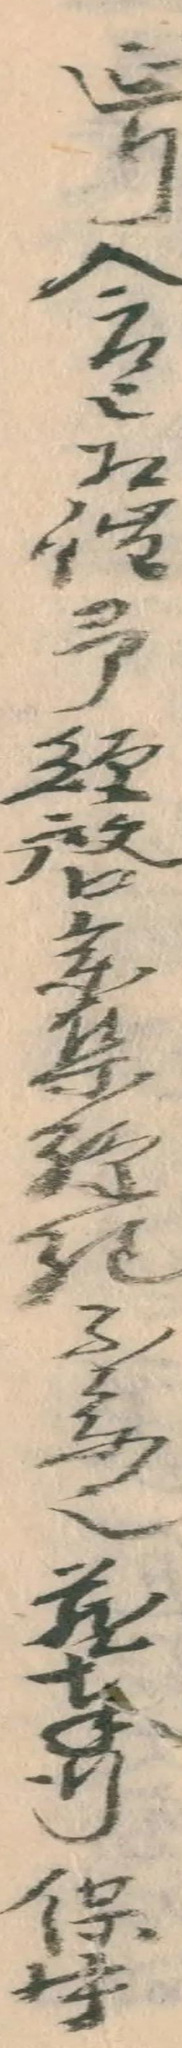延引今日被相催予経啓参集経紀不参也蔵奉行保守
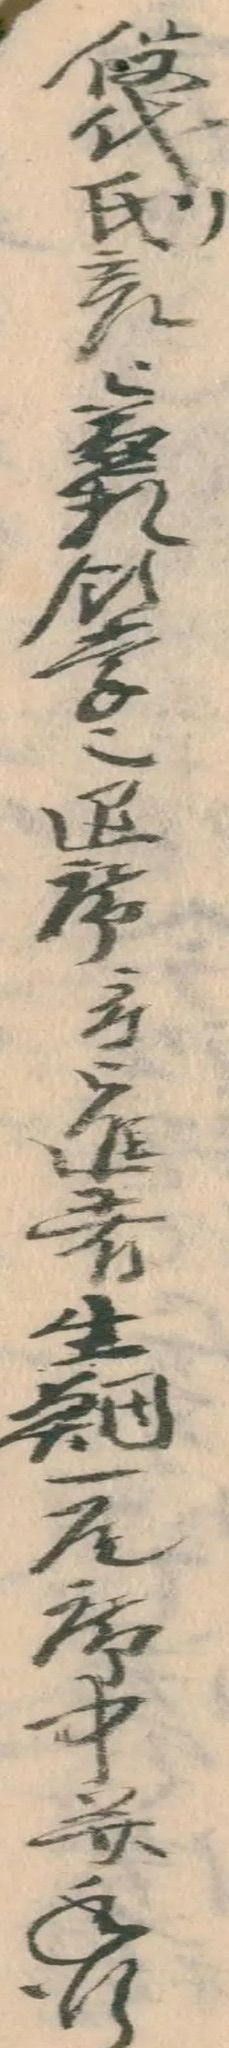役代リ氏彦へ兼類領掌也退席ニ付被進肴生鯛一尾席中并年行
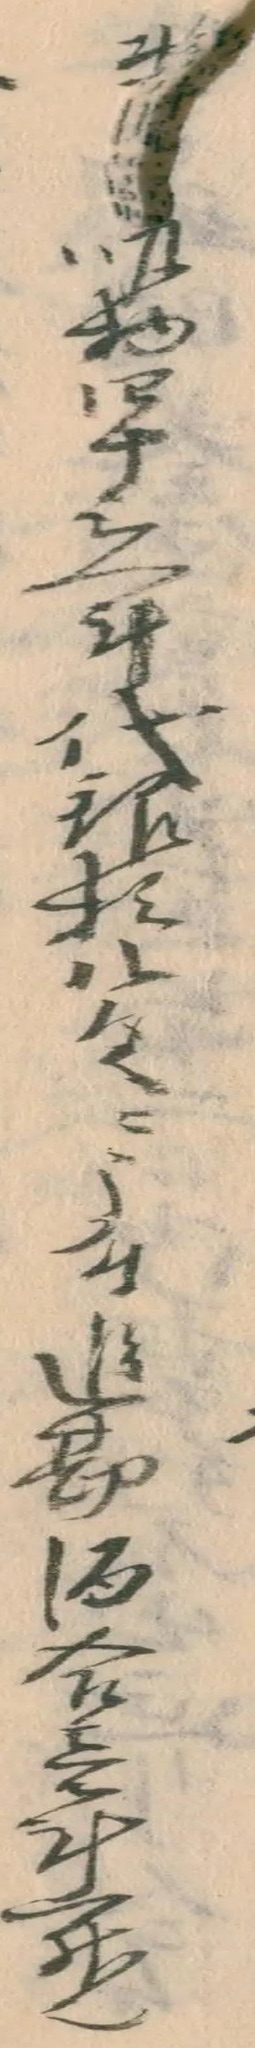吸物四十三人計代銀拾八匁ニ申付追勘酒合壱斗二升也
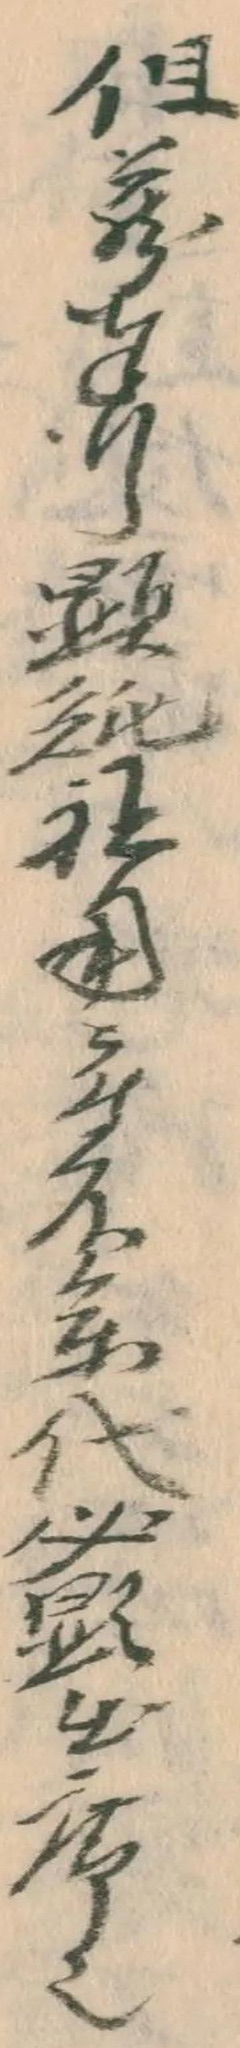但蔵奉行顕純社用ニ付不参代必顕出席也
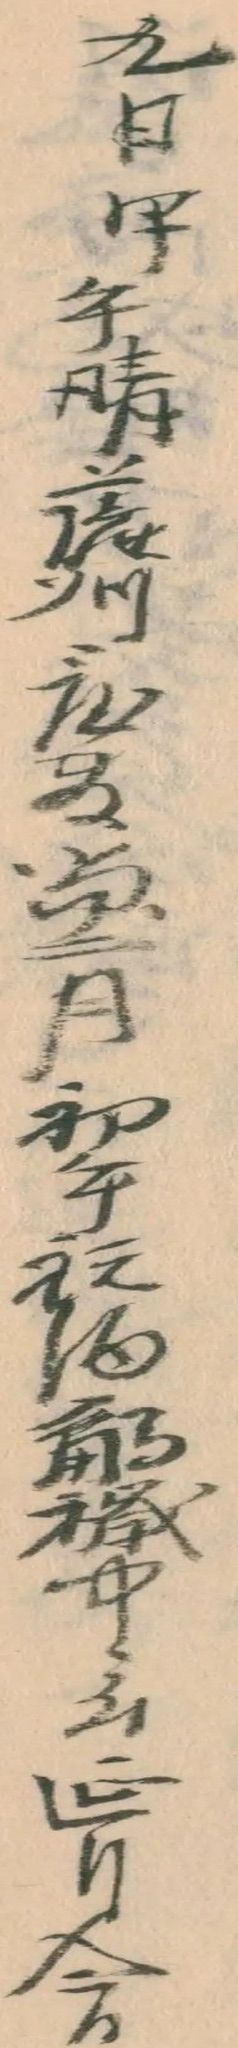九日甲午晴薩州御屋敷當二月初午祝酒触穢中ニ付延引今日
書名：賀茂社記録. 第70冊
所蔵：国立国会図書館 National Diet Library, JAPAN
